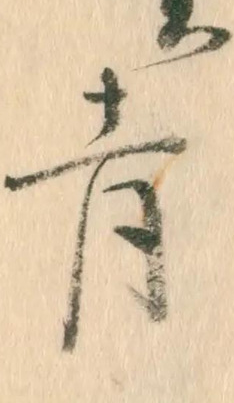亥十一月

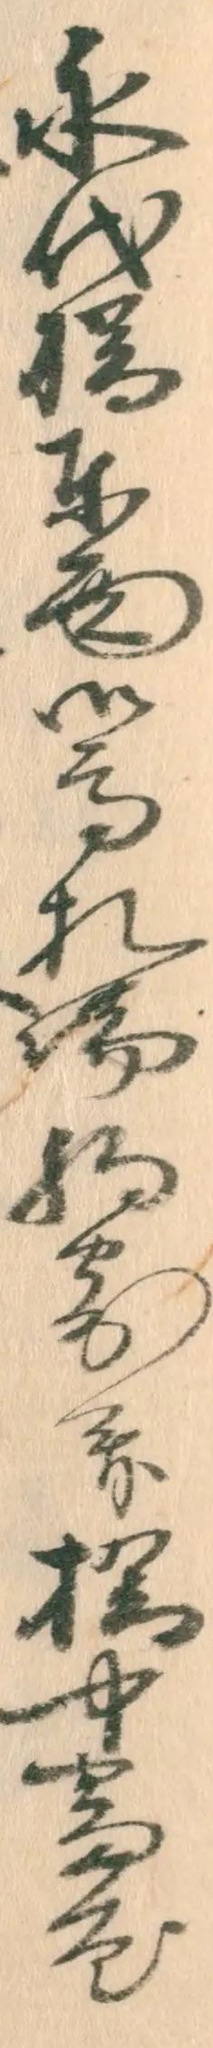永代橋東西御高札場駒寄并橋中番屋
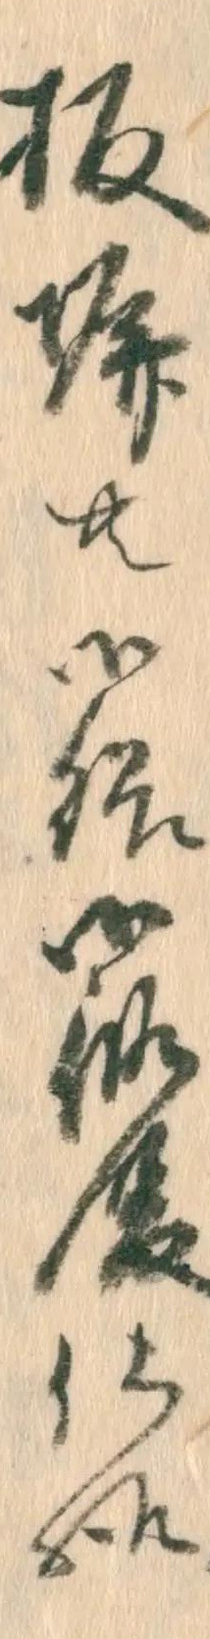板塀共御繕御修復仕様
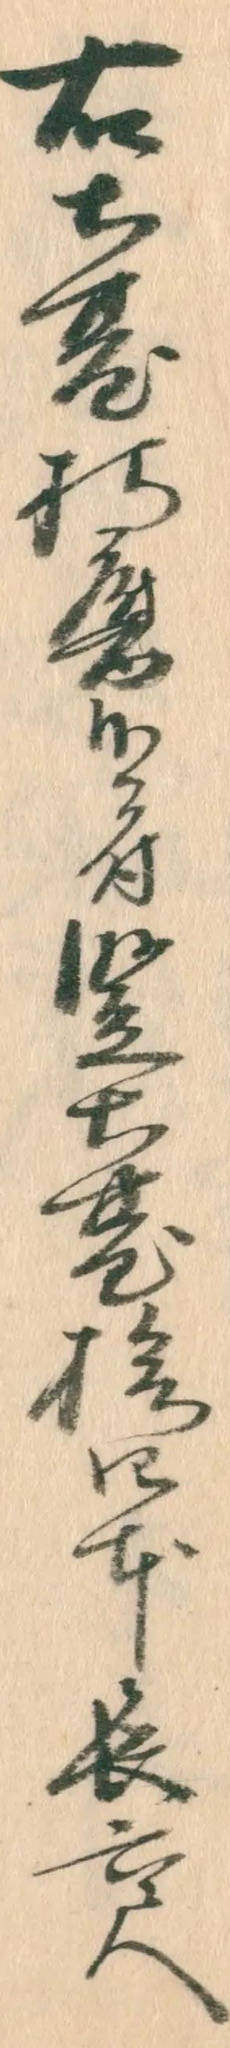右土台朽腐候ニ付竪土台桧四本長六尺
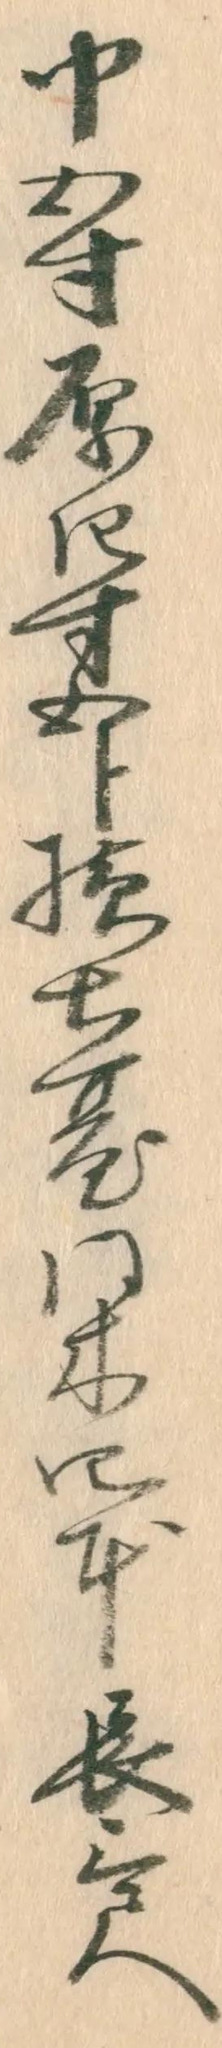中五寸厚四寸五分横土台同木四本長三尺
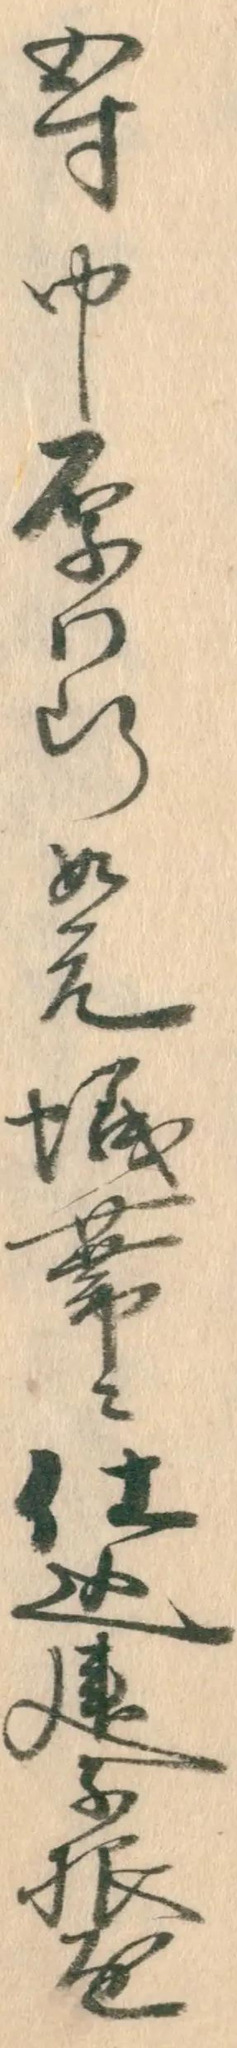五寸巾厚同断如元堀葦ニ仕込建子根懸

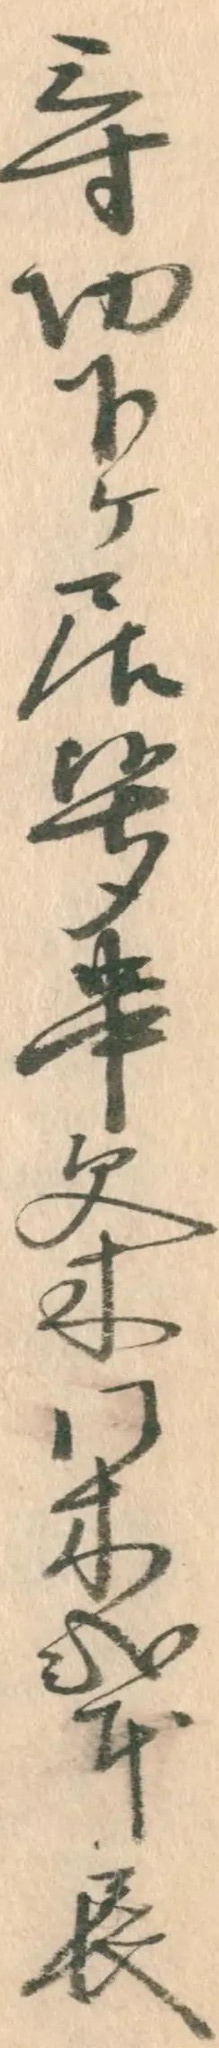三寸切下ケ居堅メ串受木同木弐本長
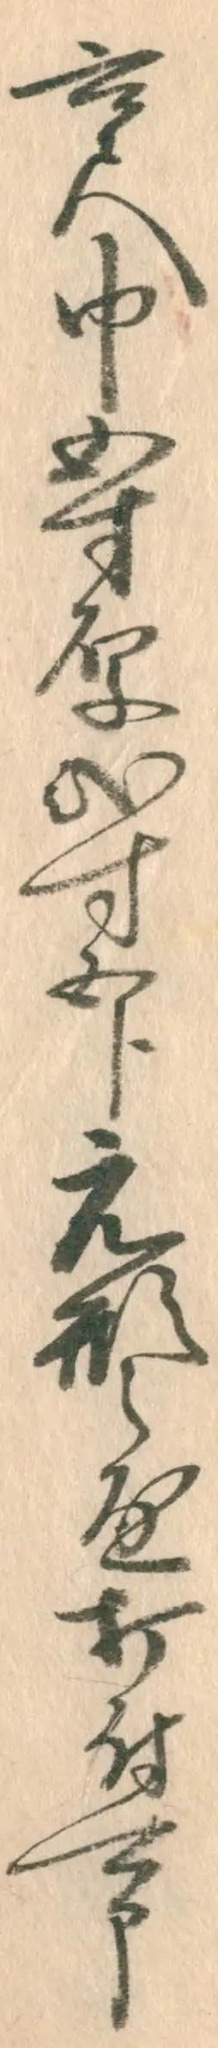六尺巾五寸厚弐寸五分元形之通打付可申
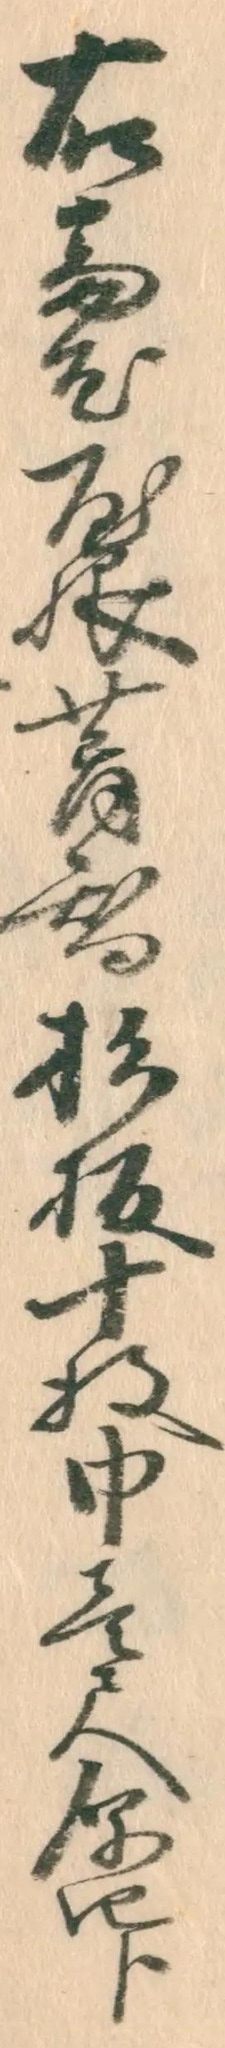右番屋屋根葺替杉板十枚巾壱尺厚四分
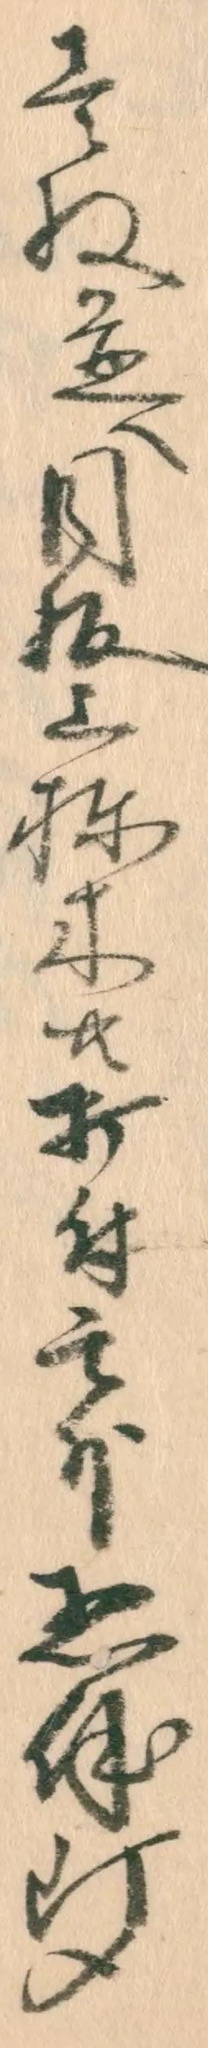壱枚並へ目板上棟木共打付其外惣体釘〆
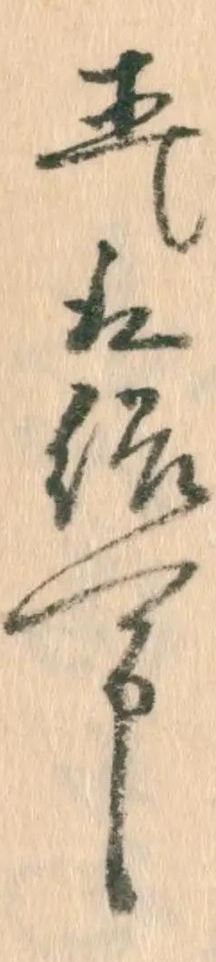直し取繕可申
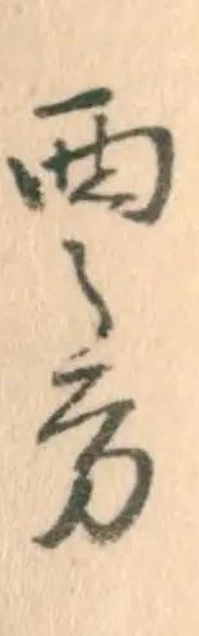西之方
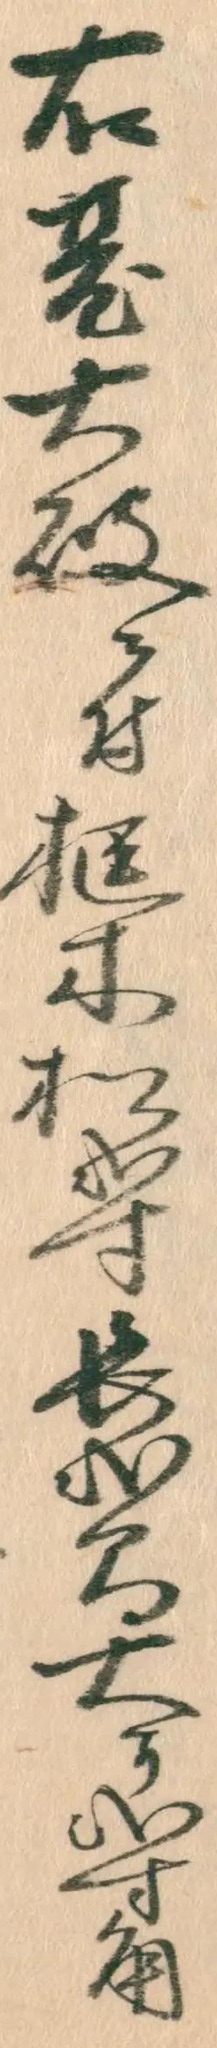右台大破ニ付框木松弐寸長弐間大サ弐寸角
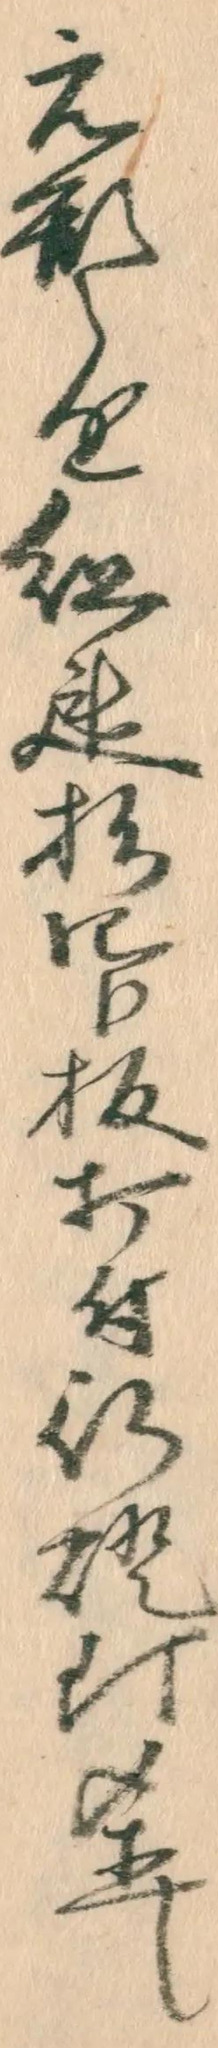元形之通組建杉四分板打付行灯釘〆直し
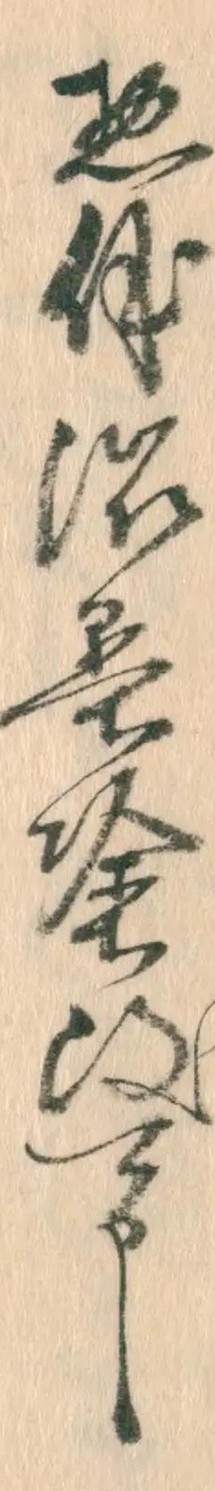惣体渋墨塗致可申
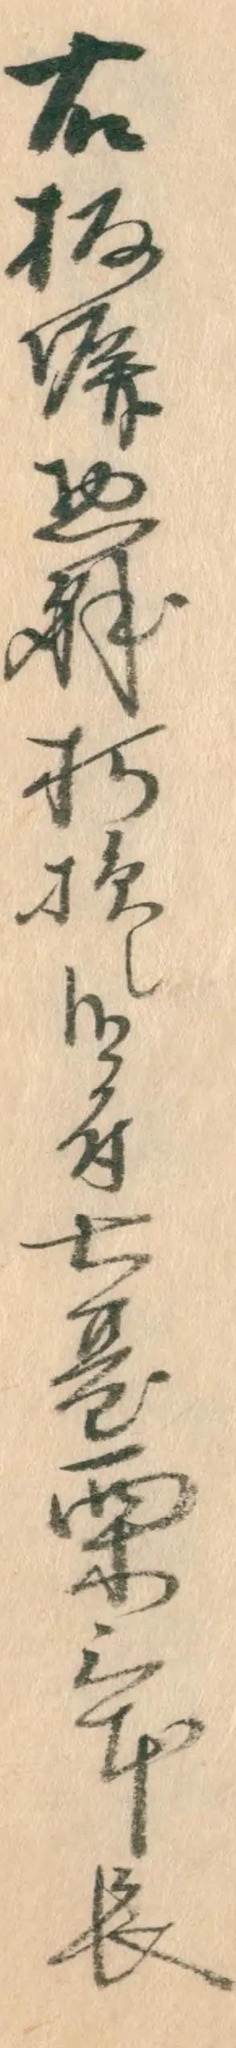右板塀惣体朽損し候ニ付土台栗三本長
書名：三橋 17巻. [7] 三橋小破御修復書留　但御奉行御掛リ替地震潰橋番屋　嘉永四亥年より安政二卯年迄　上
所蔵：国立国会図書館 National Diet Library, JAPAN
